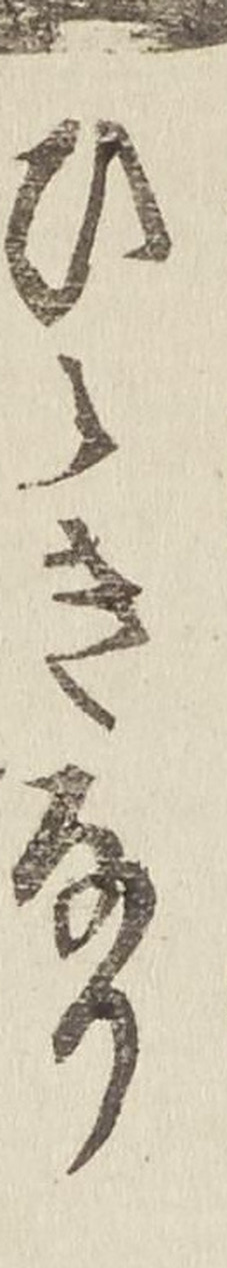ひゝきなり
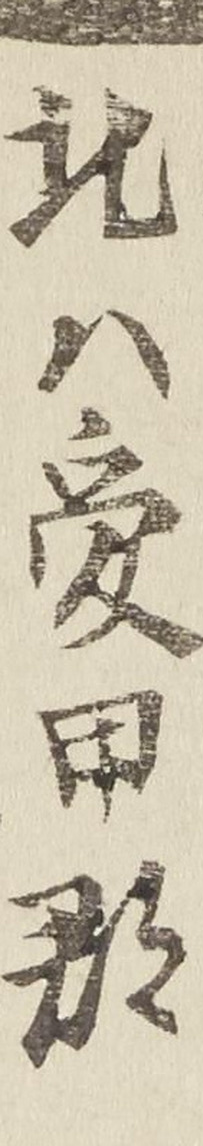北は愛甲郡
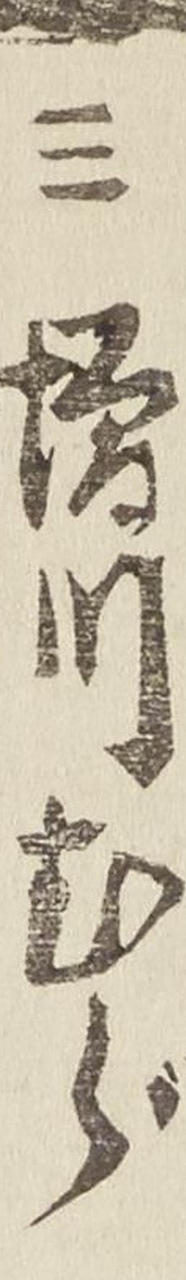三増川むら
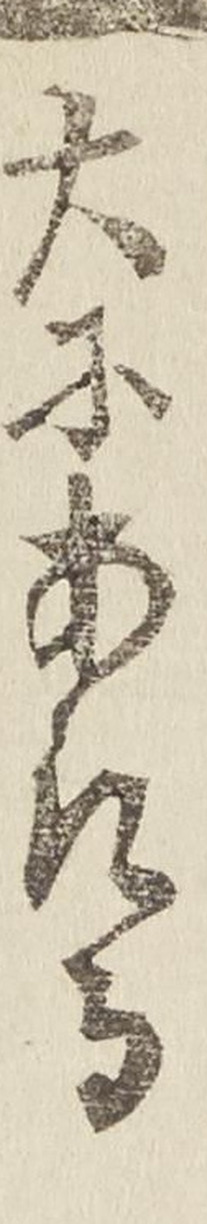大にあれる
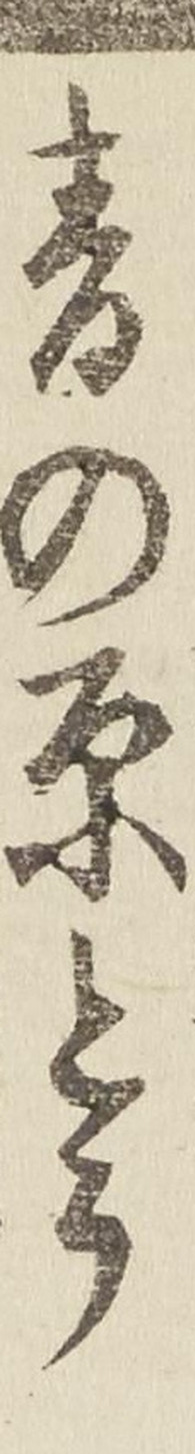青の原とう
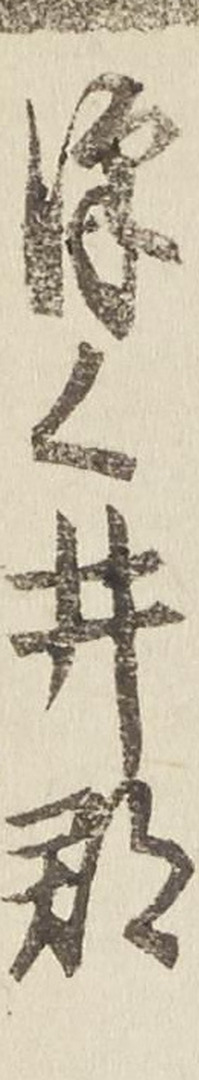つく井郡
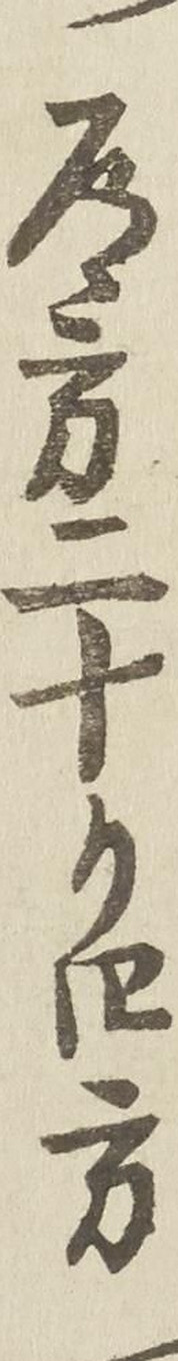道方二十り四方
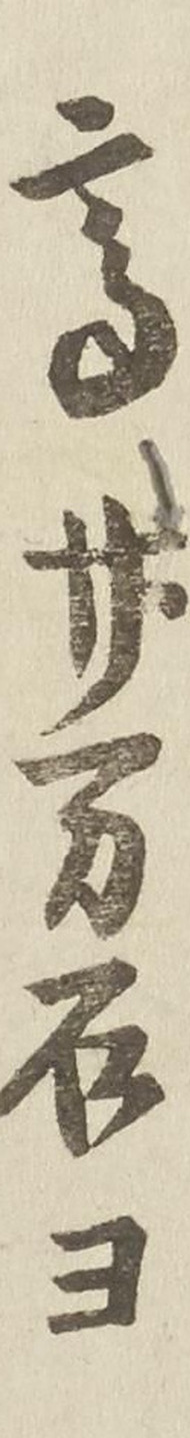高廿万石ヨ
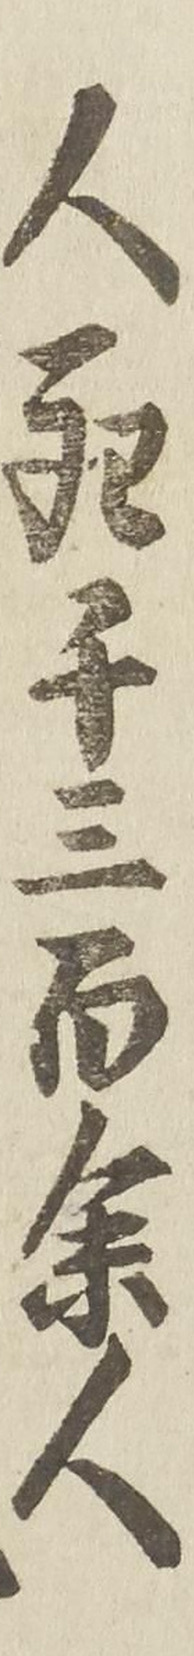人目死千三百余人
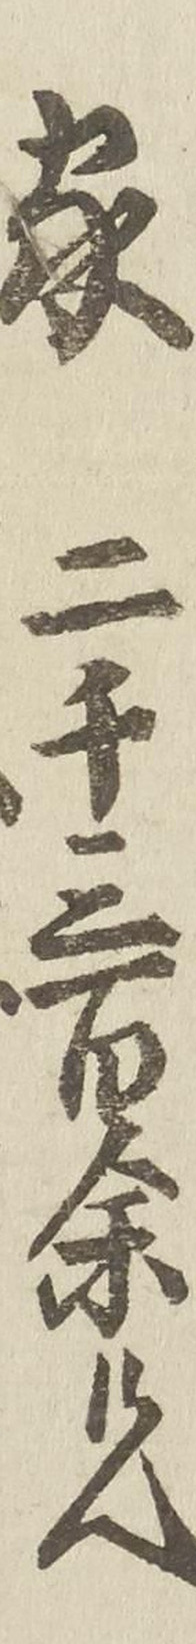家二千三百余けん
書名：相模國大地震
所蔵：東京大学地震研究所図書室 Earthquake Research Institute Library, The University of Tokyo, JAPAN
